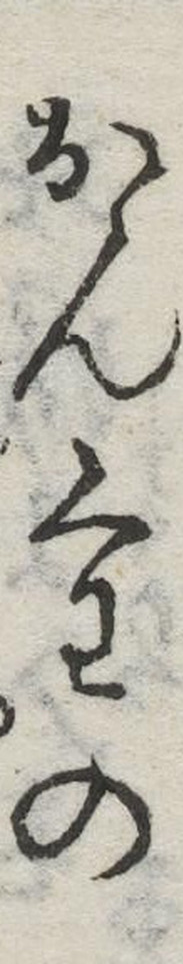おんくわの
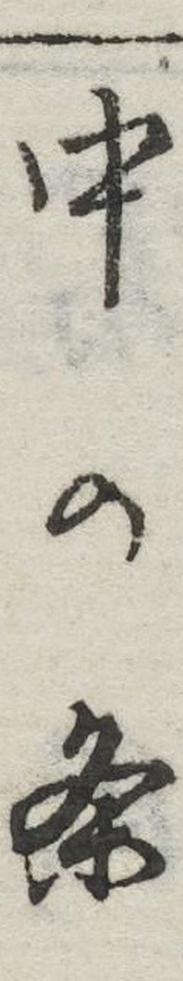中の条
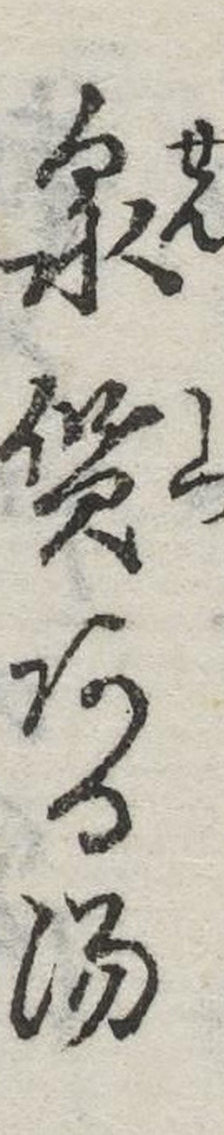泉質ある湯
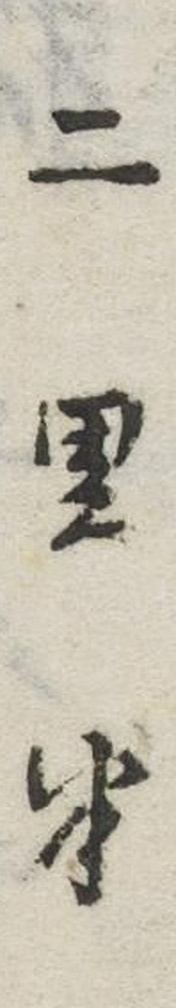二里半
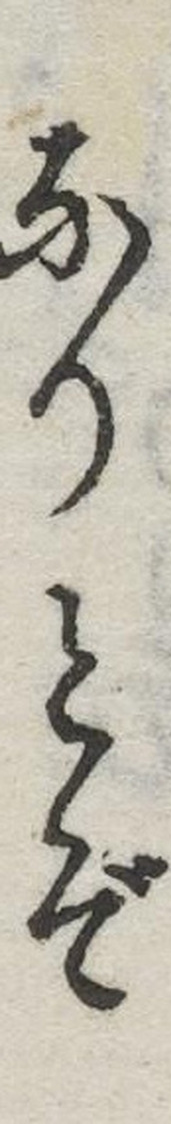なりとぞ
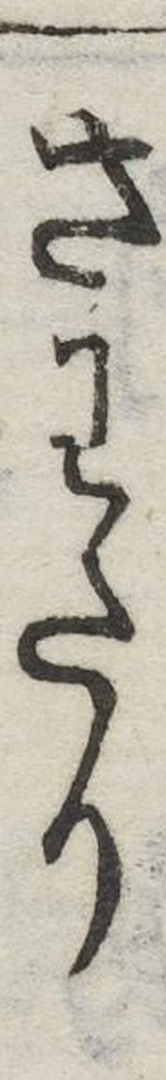さわたり
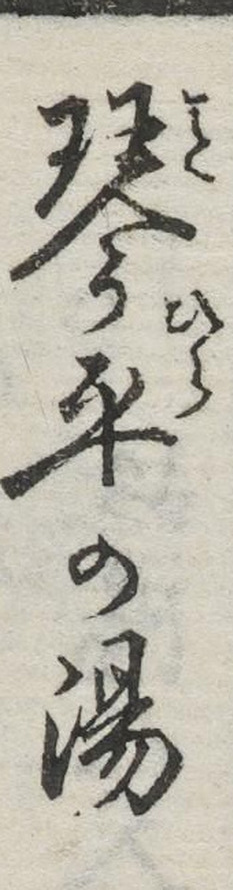琴平の湯
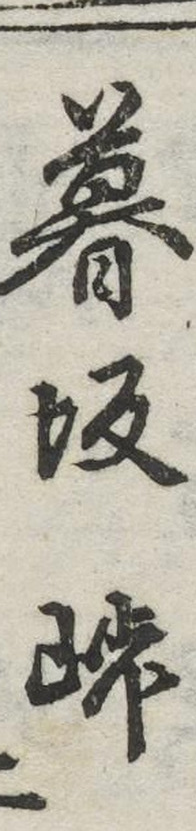暮坂峠
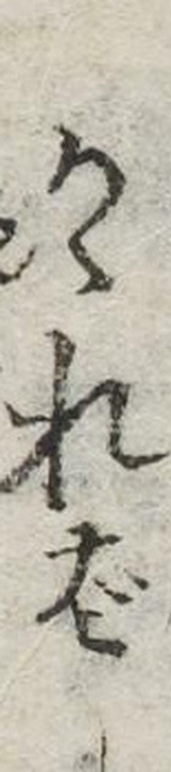かゝれば
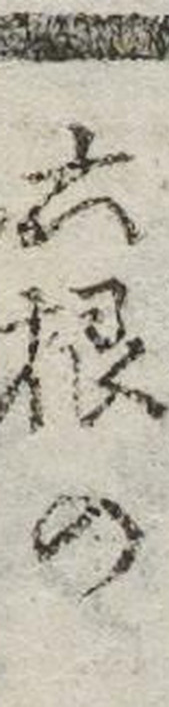六根の
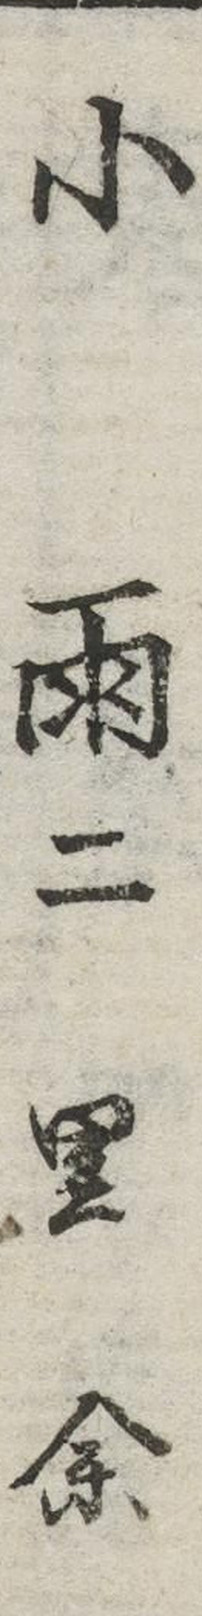小両二里余
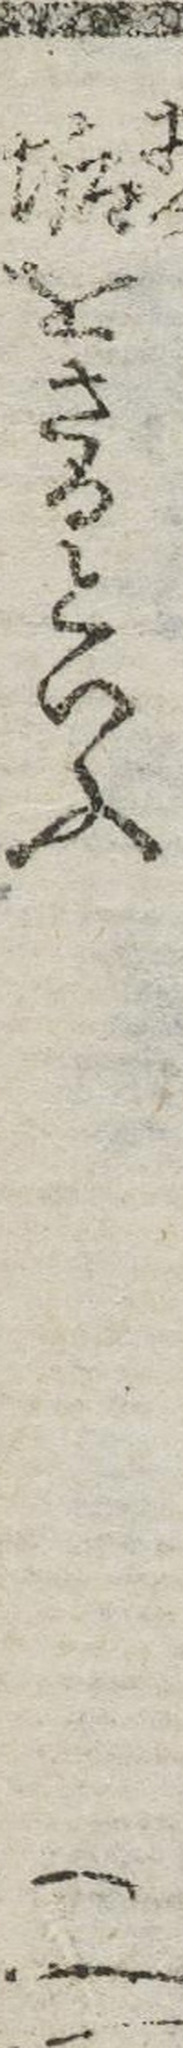垢をさるといふ
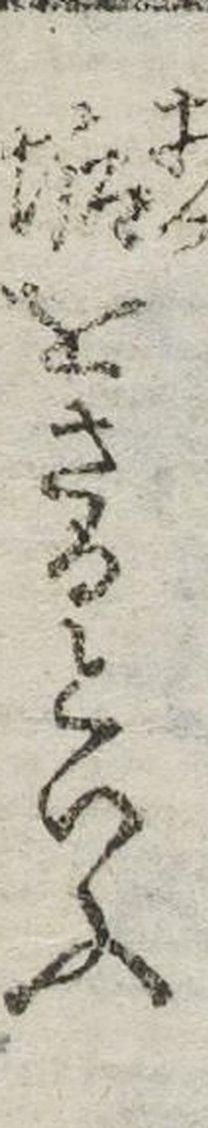垢をさるといふ

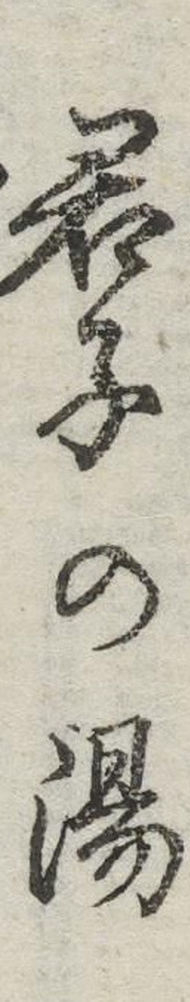君子の湯
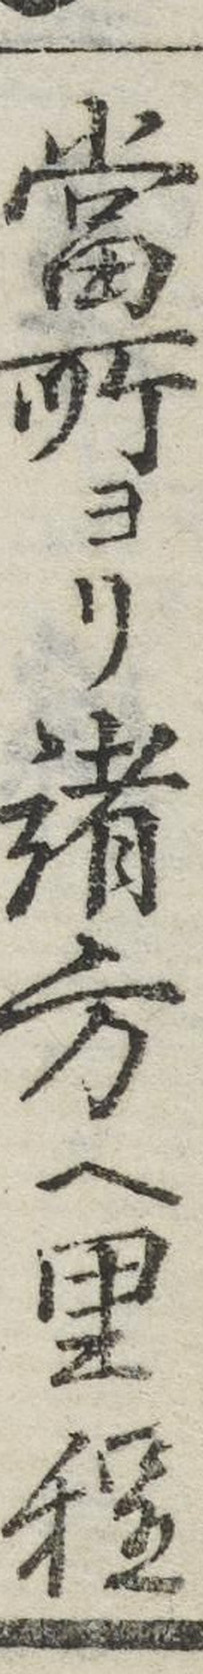当所ヨリ諸方へ里程
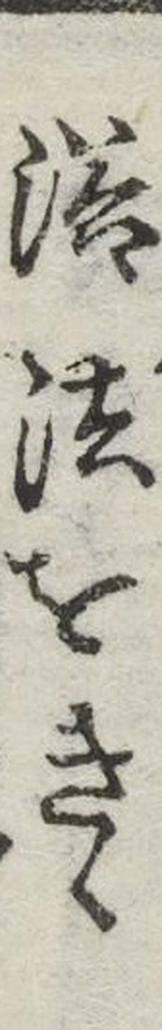浴法をきく
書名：諸國温泉遊覽記　全
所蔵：東京大学地震研究所図書室 Earthquake Research Institute Library, The University of Tokyo, JAPAN
